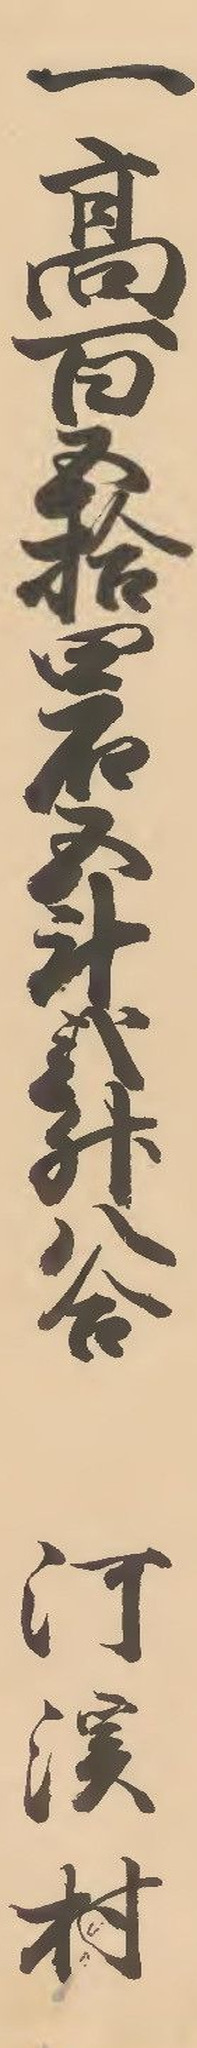一高百五拾四石五斗弐升八合河渓村

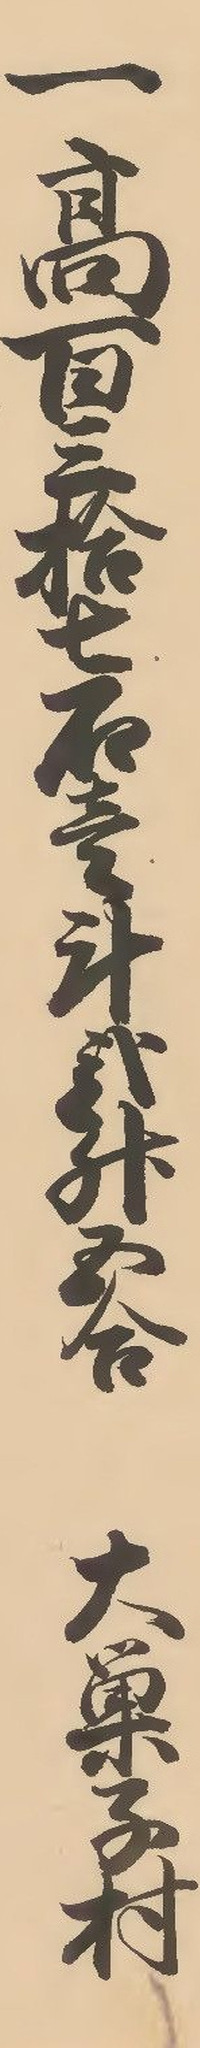一高百三拾七石壱斗弐升五合大巣子村
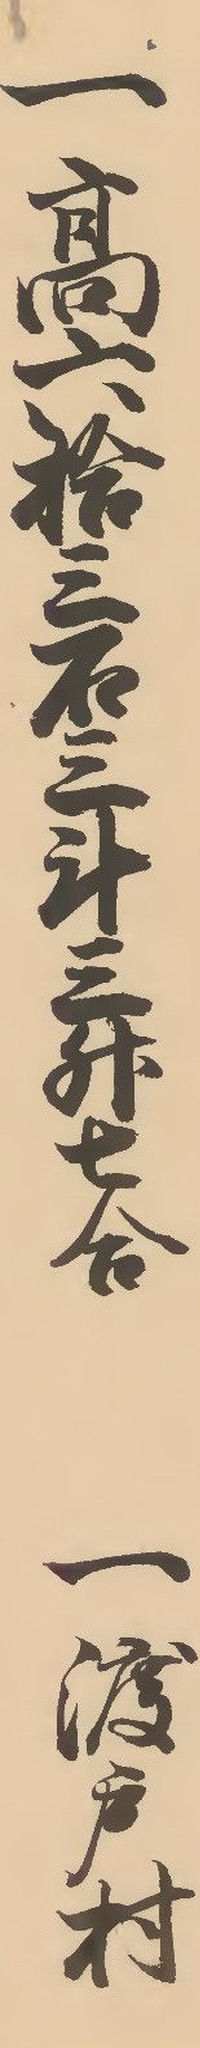一高六拾三石三斗三升七合一渡戸村
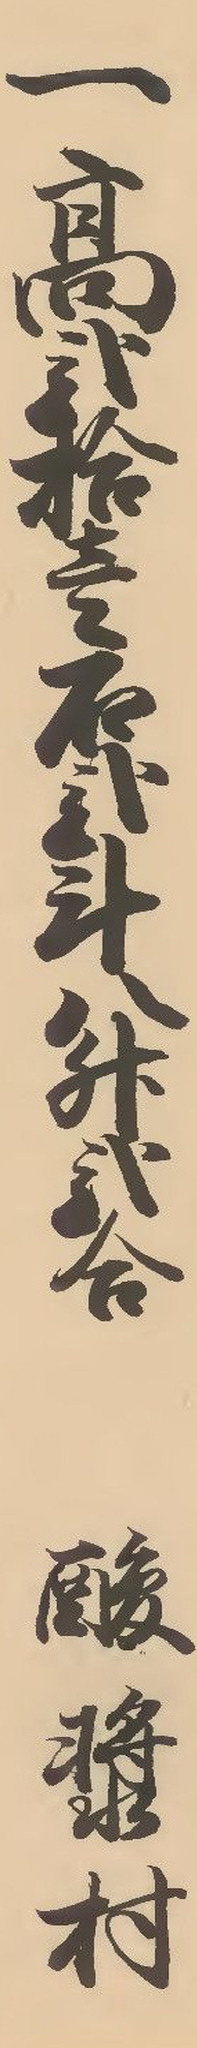一高弐ｊ壱石弐斗八升弐合酸漿村
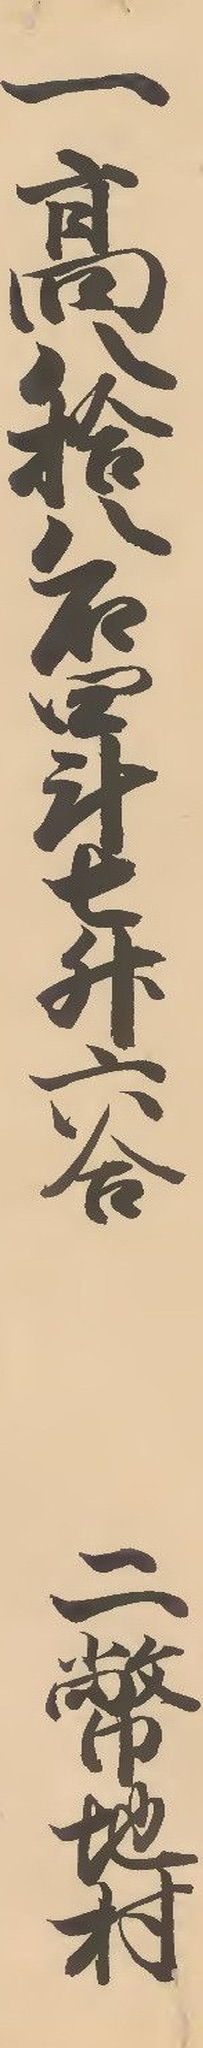一高八拾八石四斗七升六合二幣地村
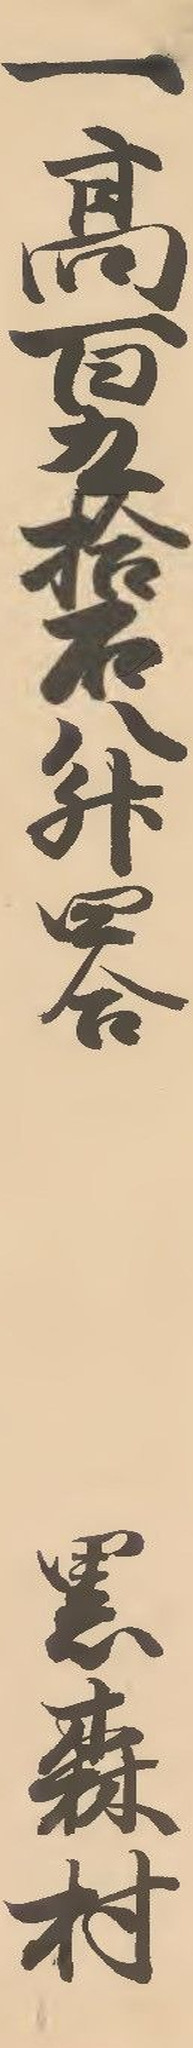一高百九拾石八升四合黒森村
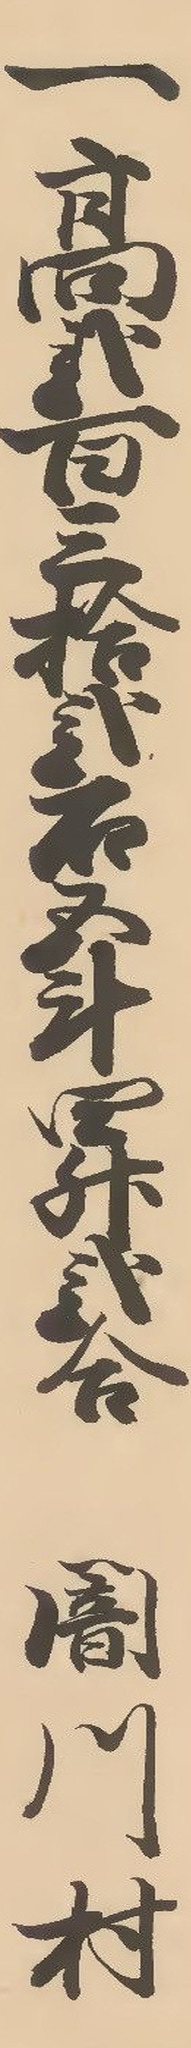一高弐百三拾弐石五斗四升弐合闇川村
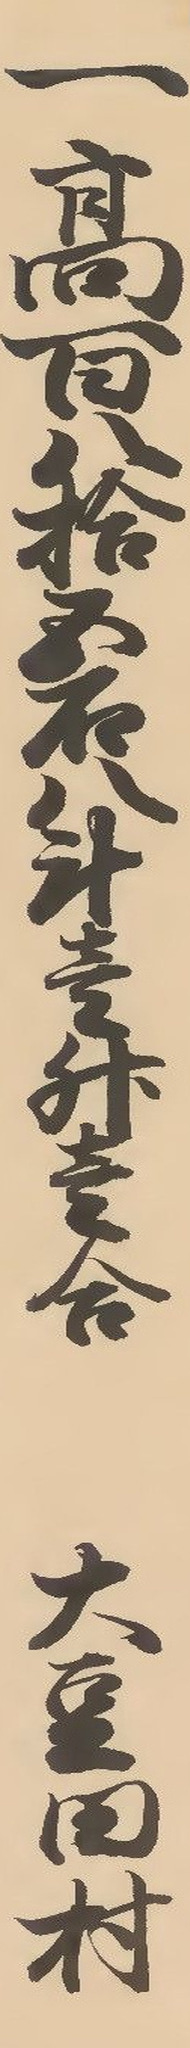一高百八拾五石八斗壱升壱合大豆田村
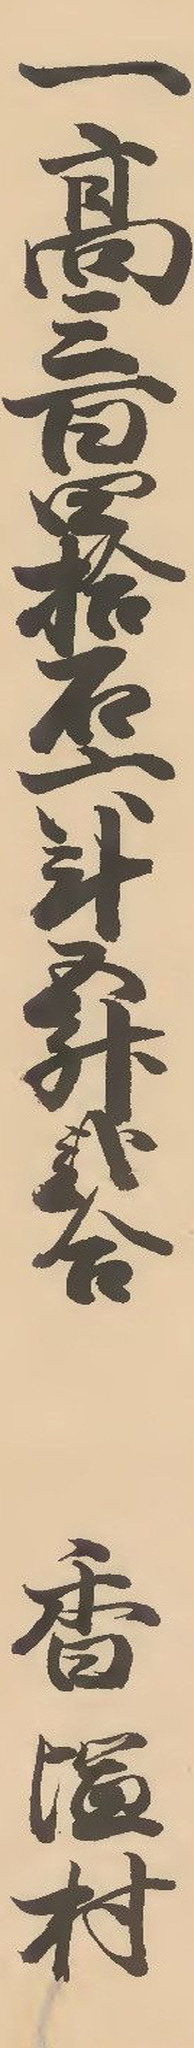一高三百四拾石六斗五升弐合香塩村

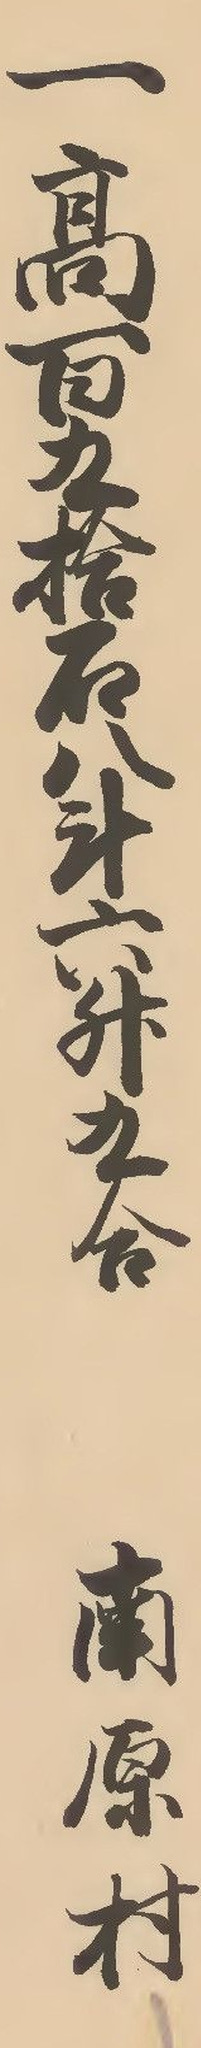一高百九拾石八斗六升九合南原村
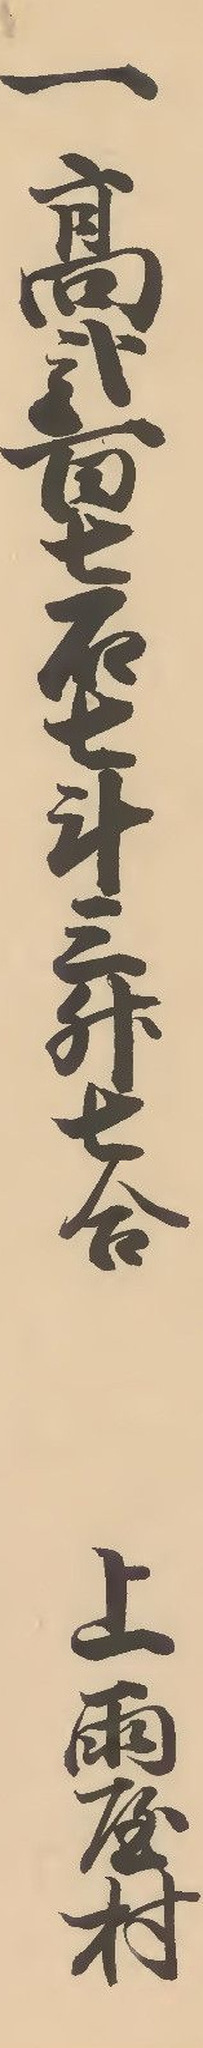一高弐百七石七斗三升七合上雨屋村
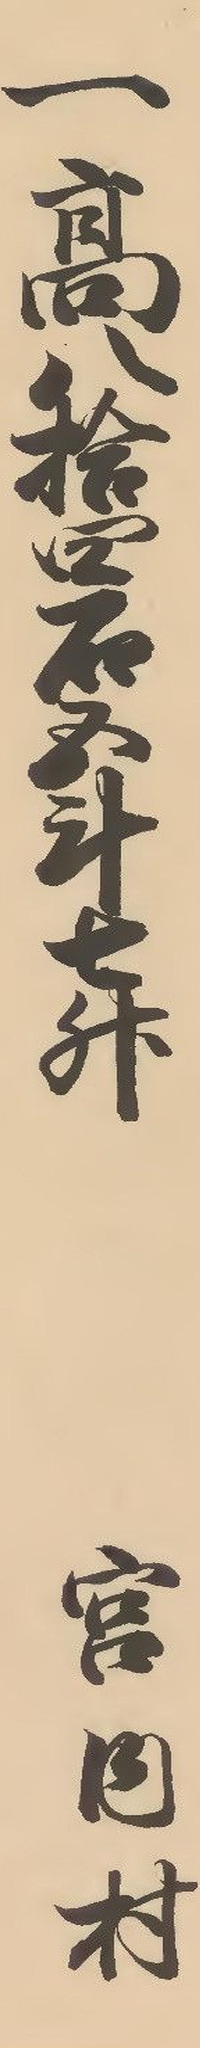一高八拾四石五斗七升宮内村
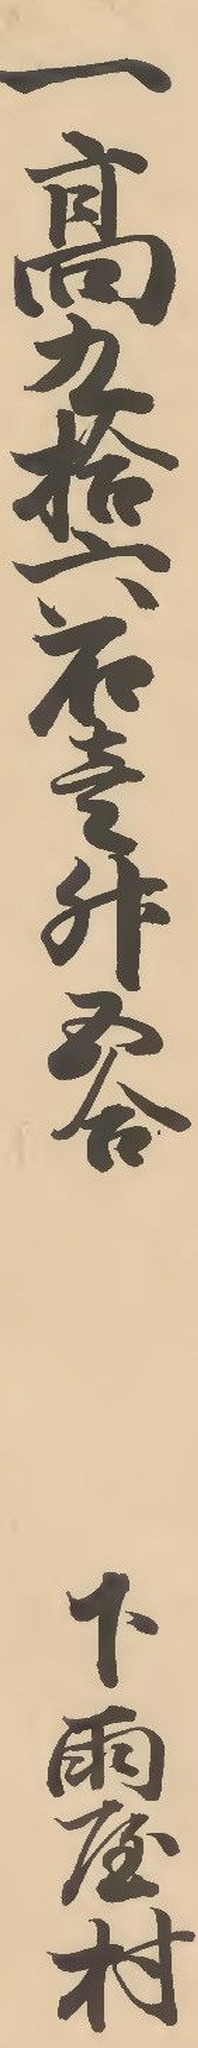一高九拾六石壱升五合下雨屋村
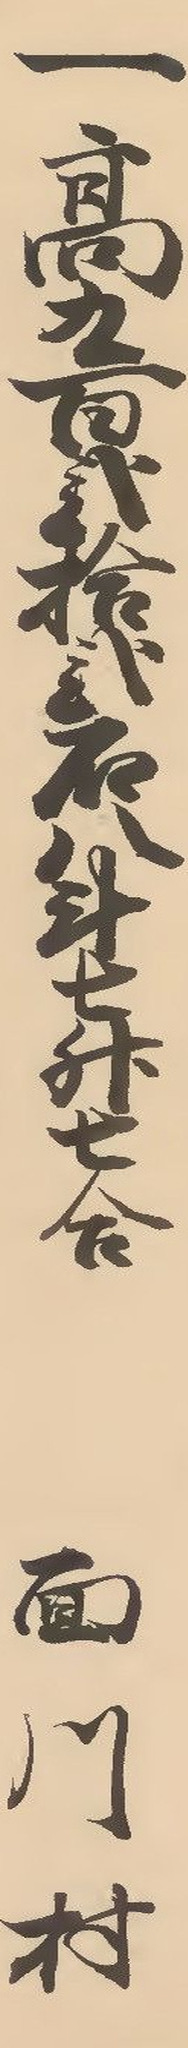一高九百弐拾弐石八斗七升七合面川村
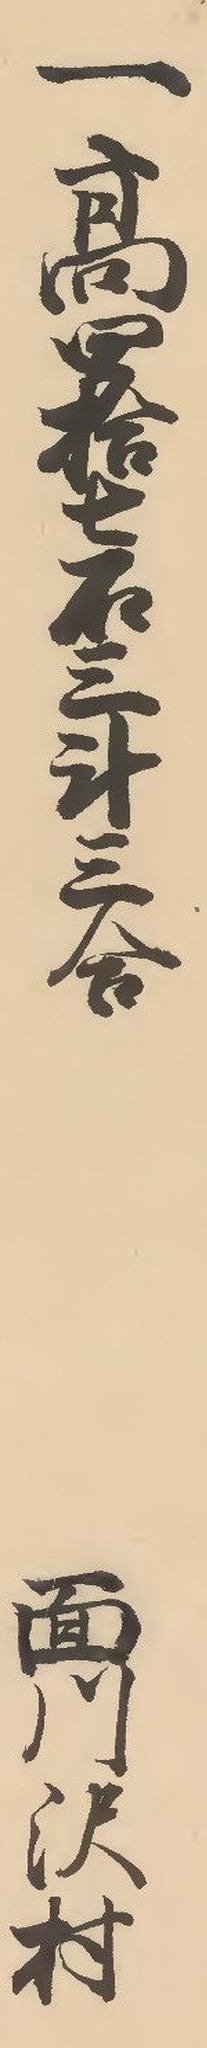一高四拾七石三斗三合面川沢村
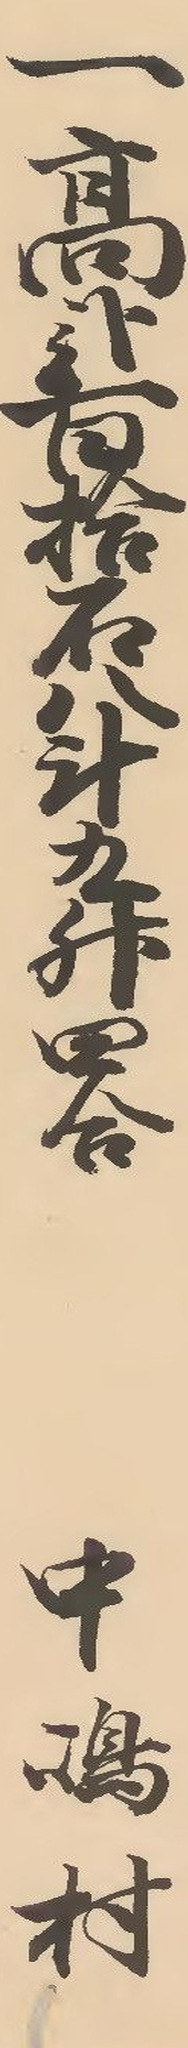一高弐百拾石八斗九升四合中島村
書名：陸奥国郷帳　１
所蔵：国立公文書館 National Archives of Japan
